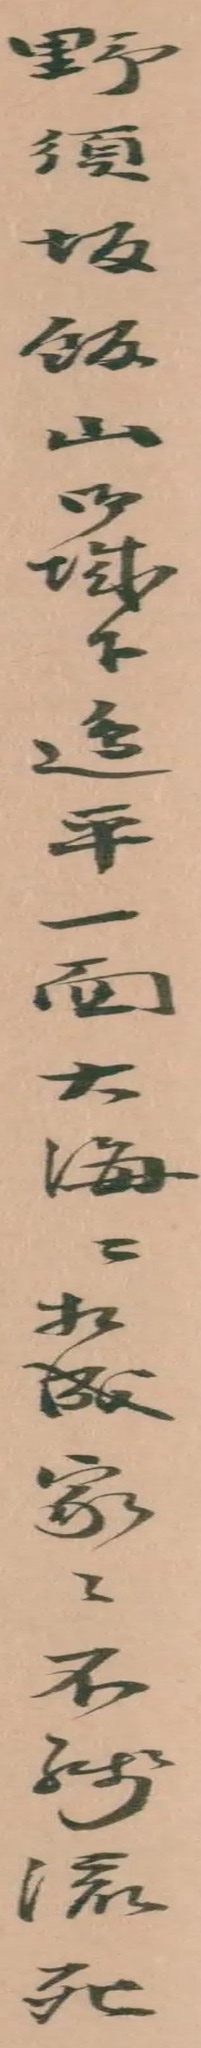野須坂飯山御城下辺平一面大海二相成家々不残流死
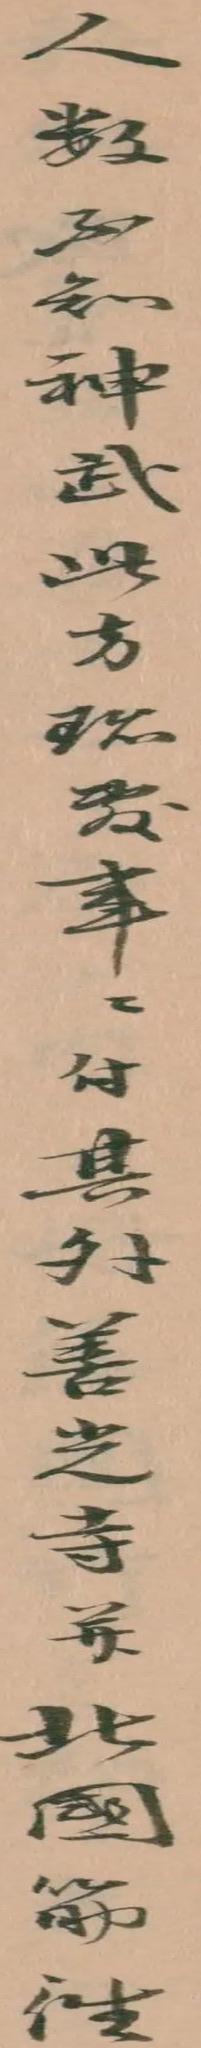人数不知神武此方珍敷事二付其外善光寺并北国筋往
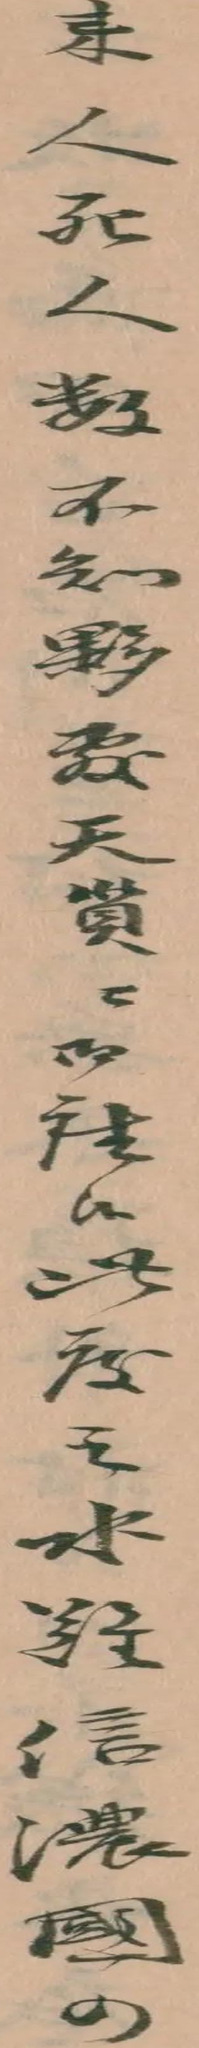来人死人数不知夥敷天災二御座候此度之水難信濃国の
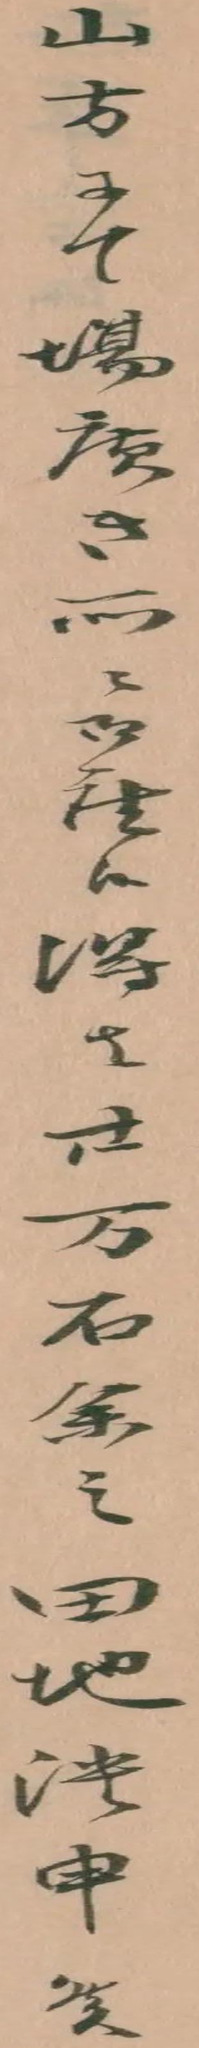山方にて場広き所二御座候得者廿万石余之田地潰申候
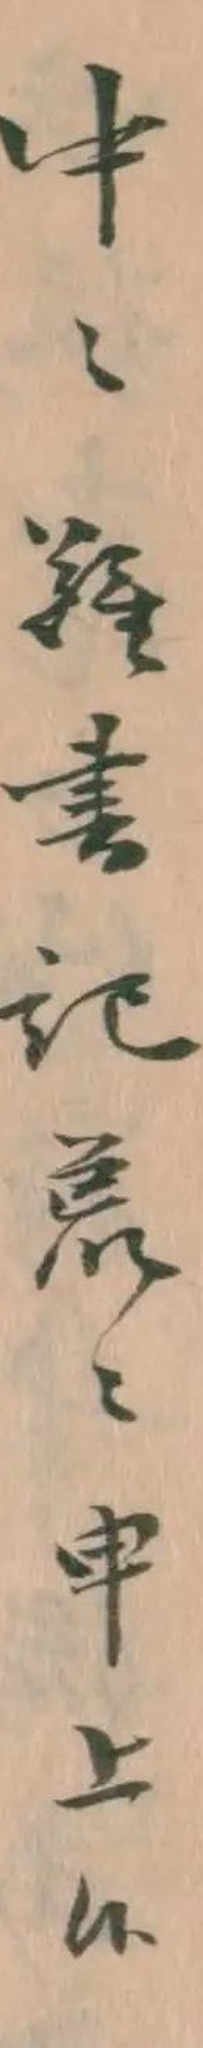中々難書記荒々申上候

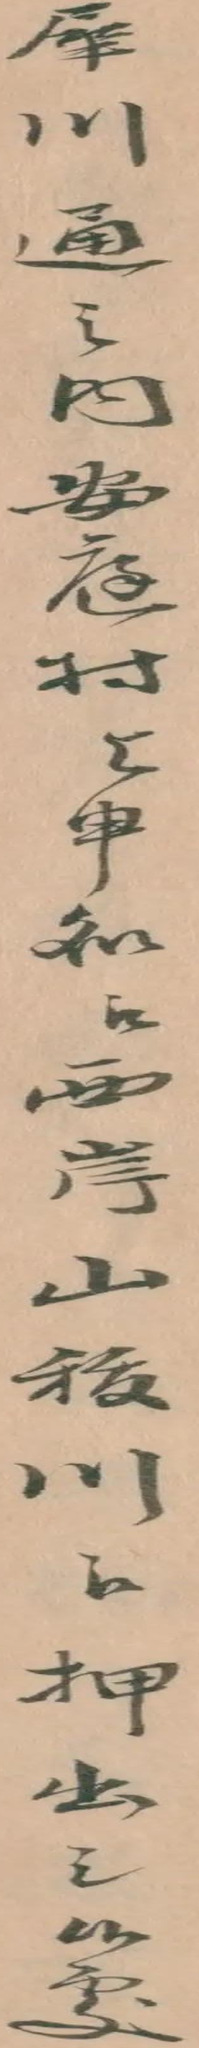犀川通之内安庭村と申処江西山抜川江押出シ候処
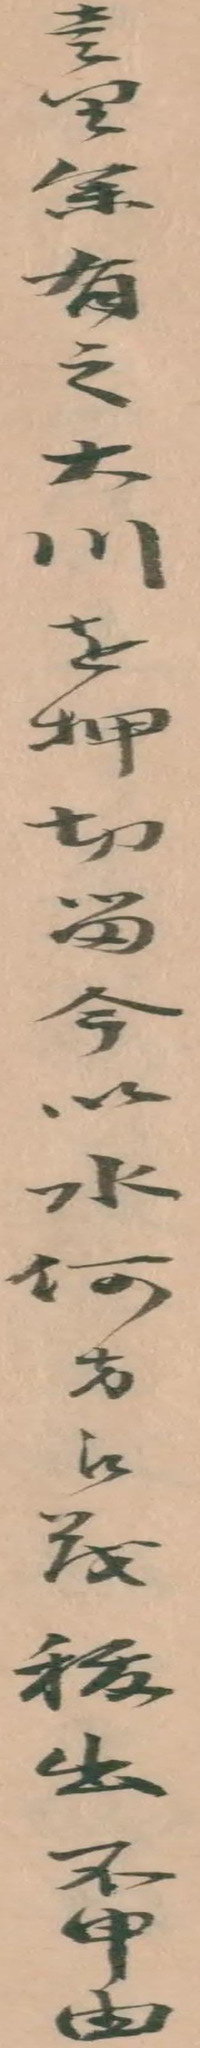壱里余有之大川を押切留今以水何方江も抜出不申由
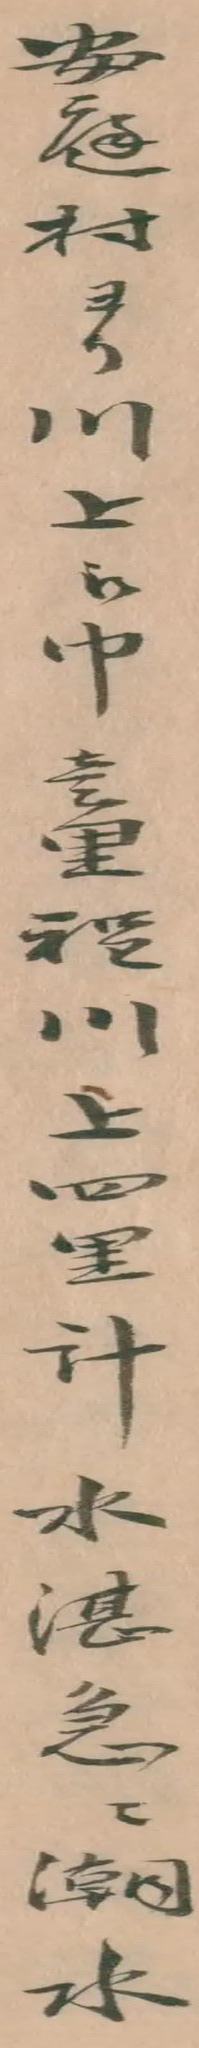安庭村より川上も巾壱里ほ程川上四里計水湛急二湖水
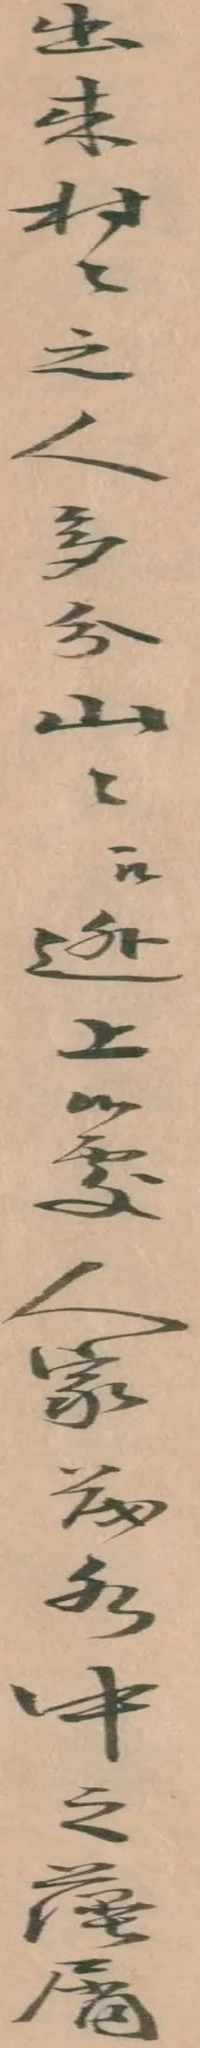出来村々之人多分山々二逃上候処人家も水中之藻屑
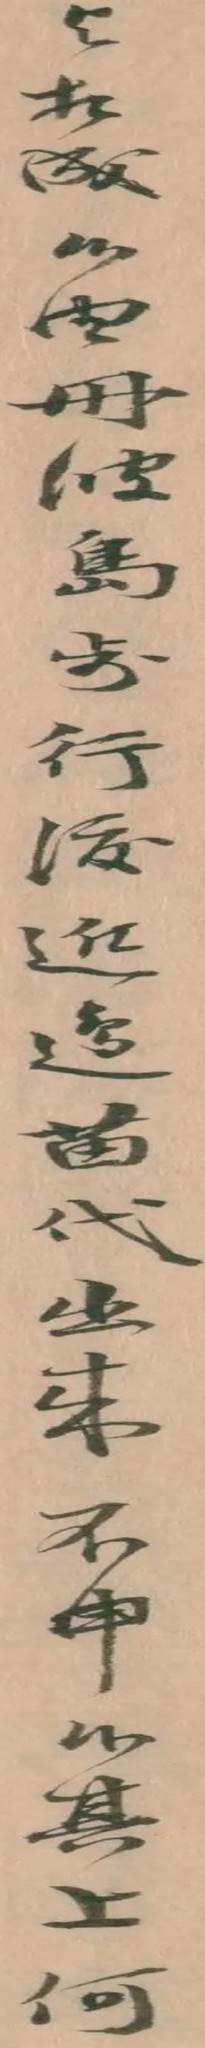と相成候由丹波嶋歩行渡近辺苗代出来不申候其上何
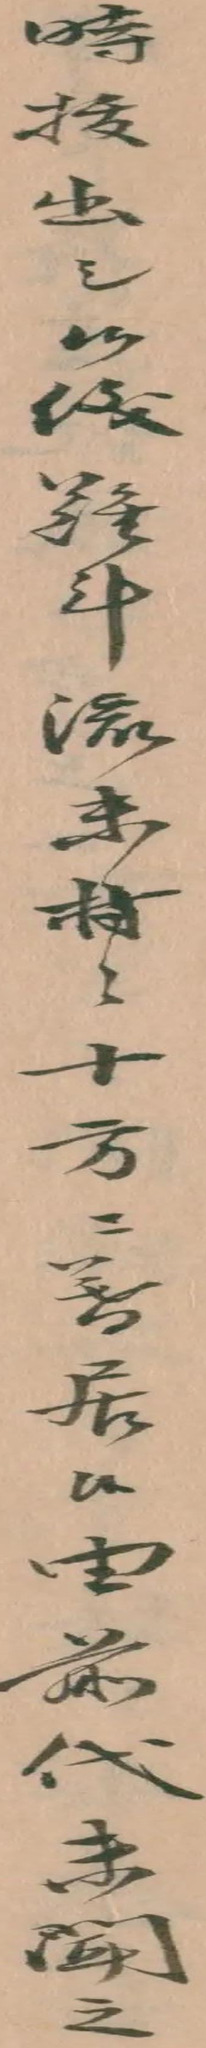時抜出シ候義難斗流末村々十方二暮居候由前代未聞之
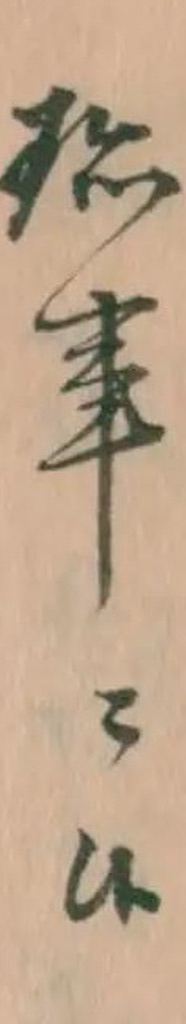珍事二候
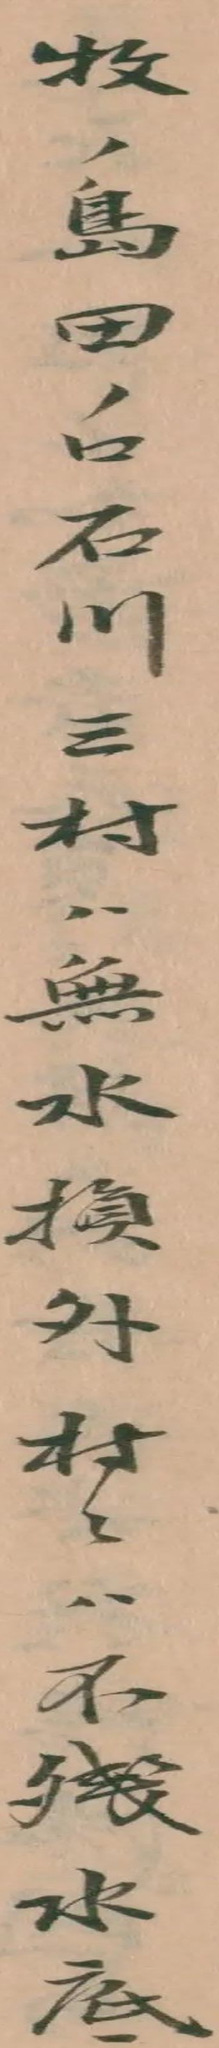牧之島田ノ口石川三村ハ無水損外村々ハ不残水底
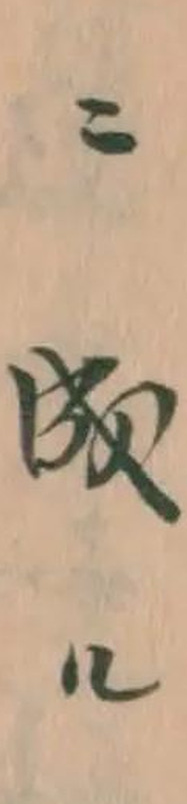二成ル
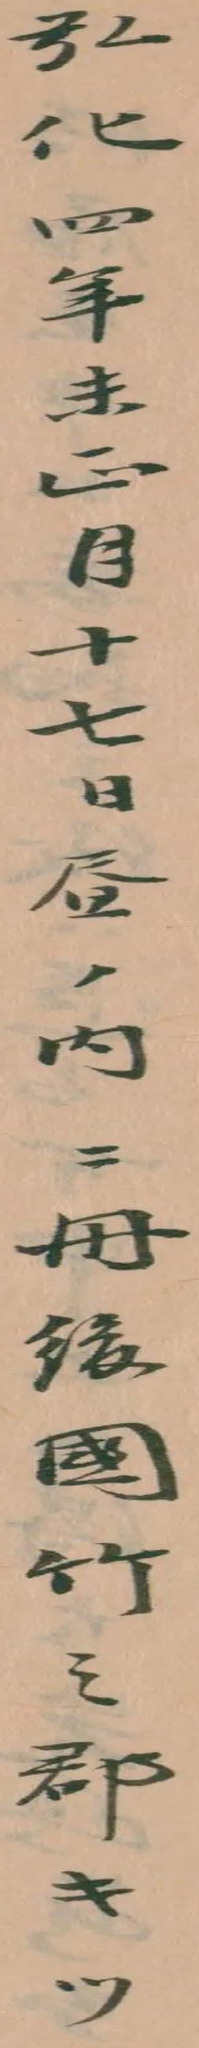弘化四年未正月十七日昼ノ内二丹後国竹野郡キツ
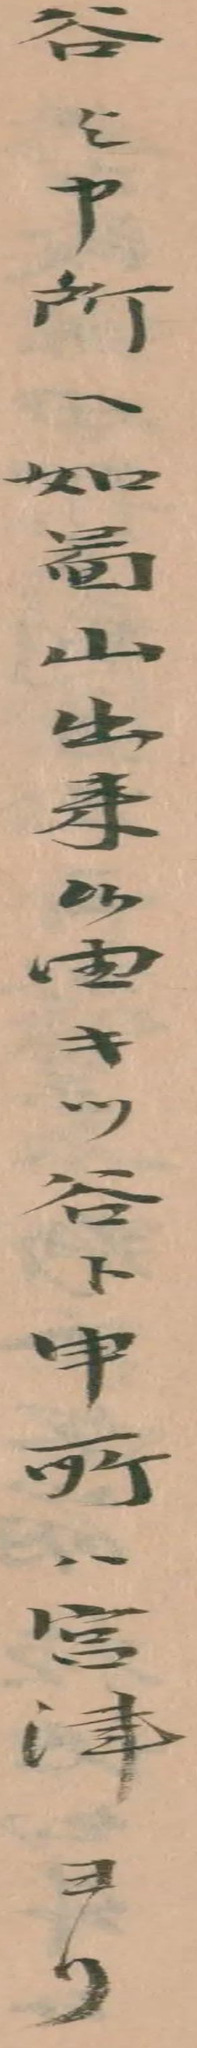谷と申所へ如図山出来候由キツ谷ト申所ハ宮津ヨリ
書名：地災撮要. 巻3(地震之部)-巻4(噴火之部)
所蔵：国立国会図書館 National Diet Library, JAPAN
